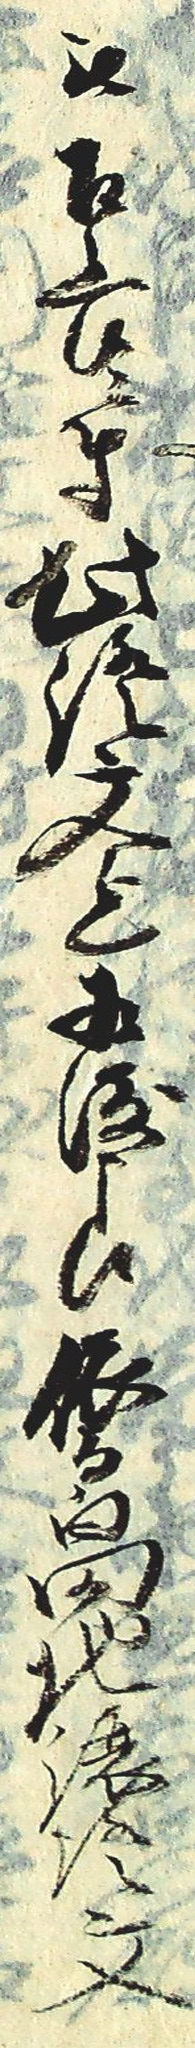被召上候に付此証文迄相渡申候仍て畠地譲証文
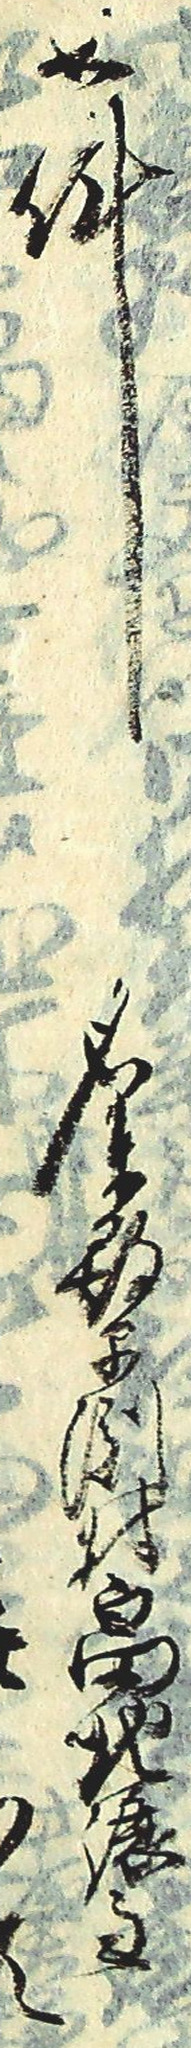如件名東郡早淵村畠地譲主
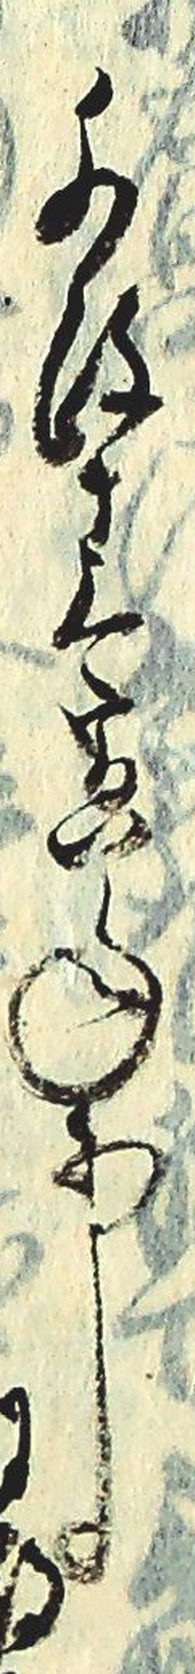文政十三寅年五月
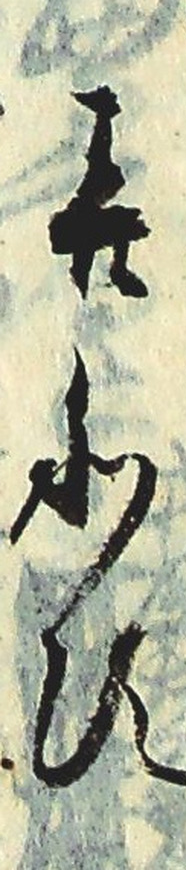喜和次
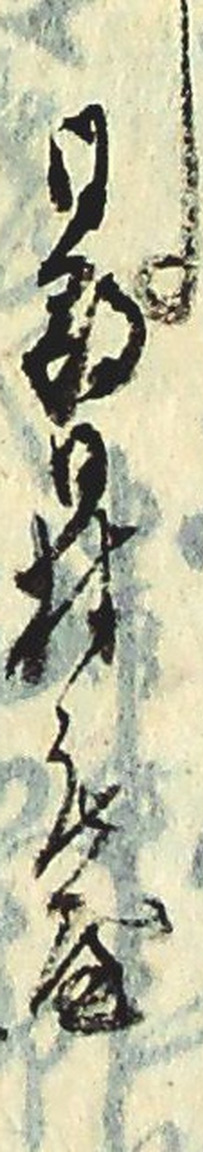同郡同村庄屋
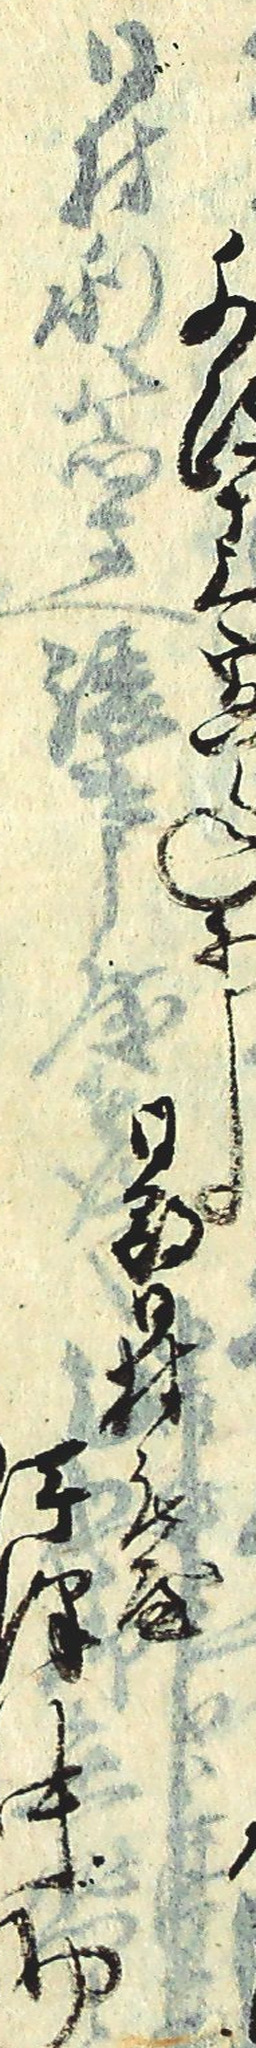同郡同村庄屋
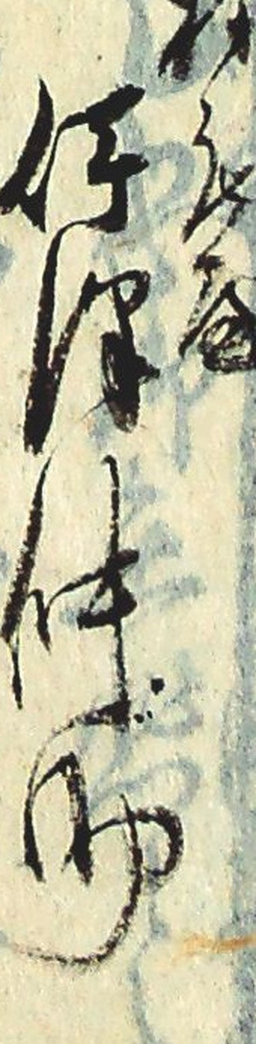伊沢仲助
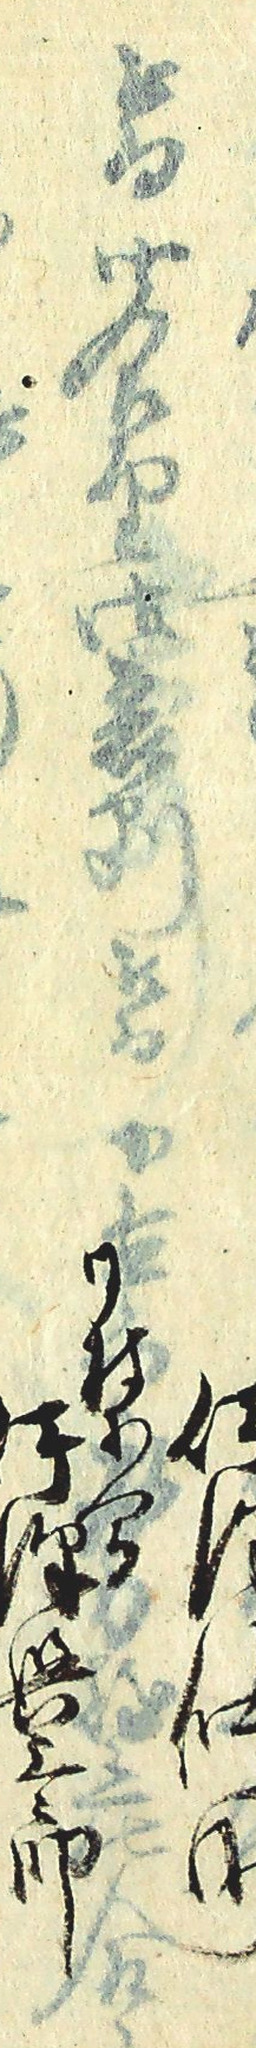伊沢与三郎
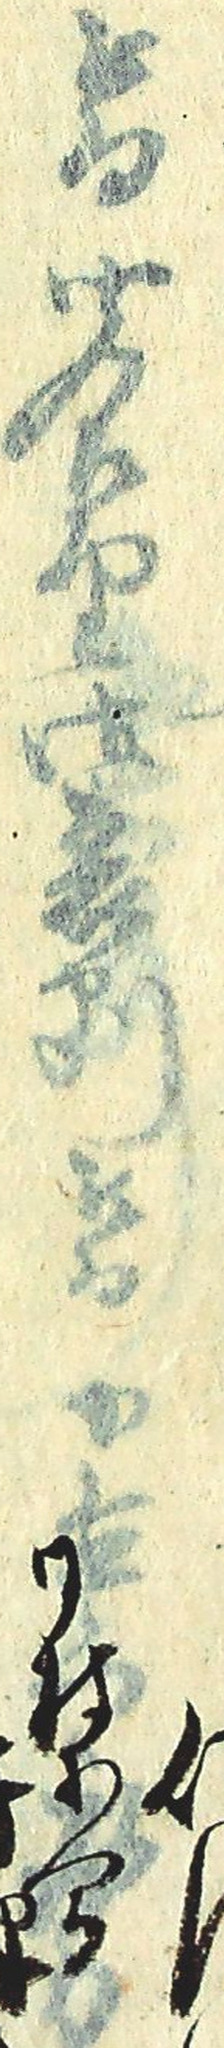同村五人与
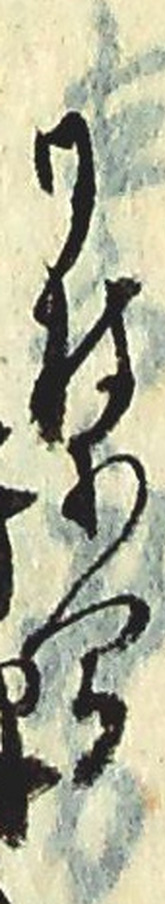同村五人与
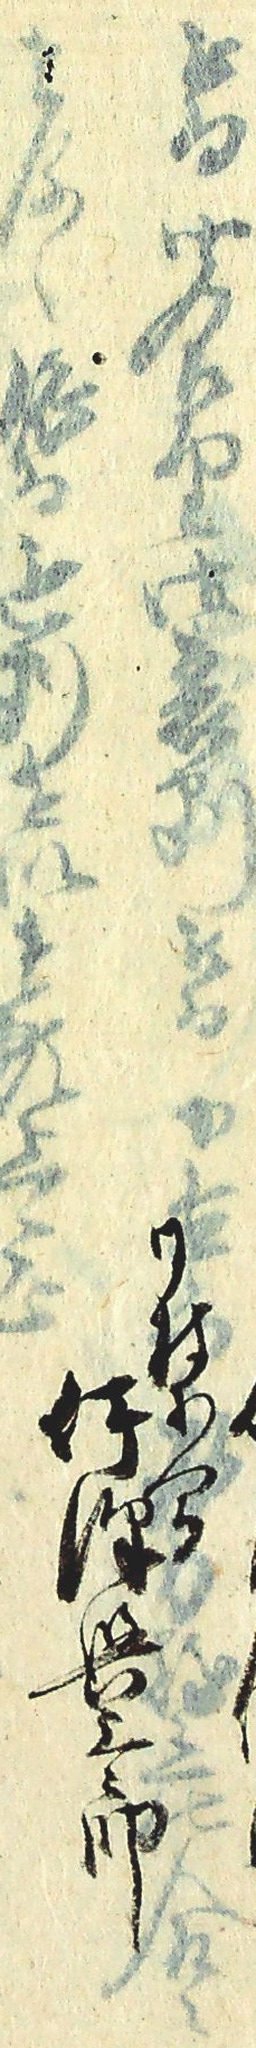伊沢与三郎
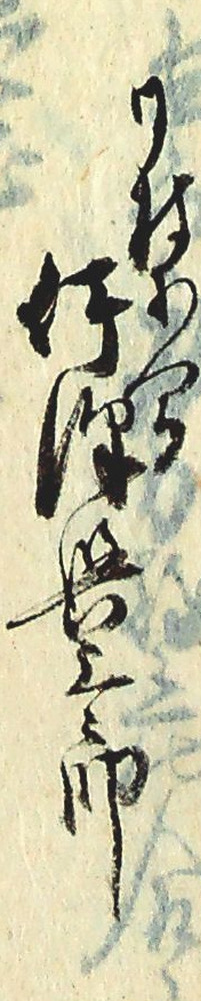伊沢与三郎
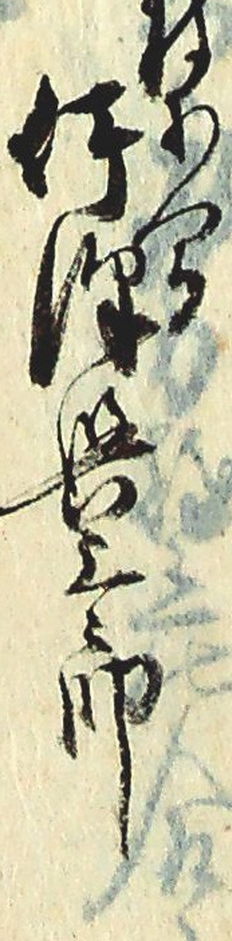伊沢与三郎
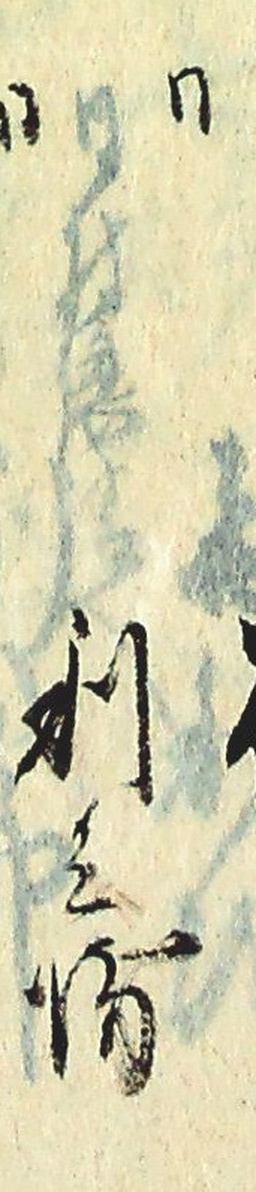同利兵衛
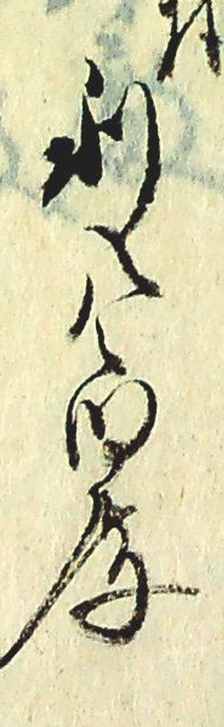利八郎殿
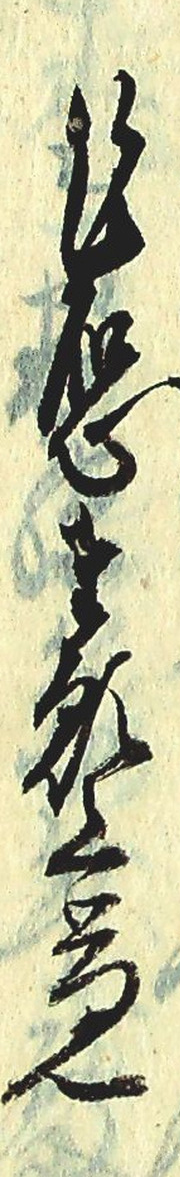乍恐奉願上覚
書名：諸御願書控(弐番）
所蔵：鳴門教育大学 Naruto University of Education
